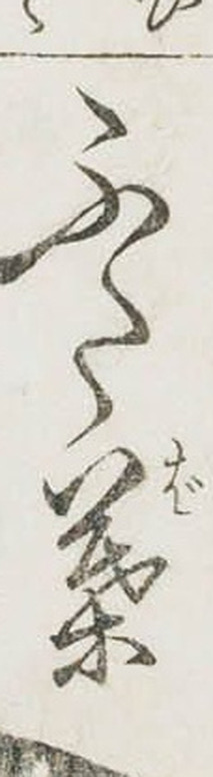ふた葉
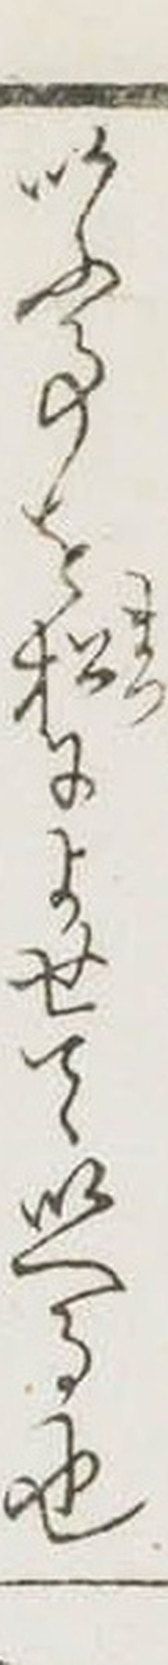いふ事を松によせていへる也
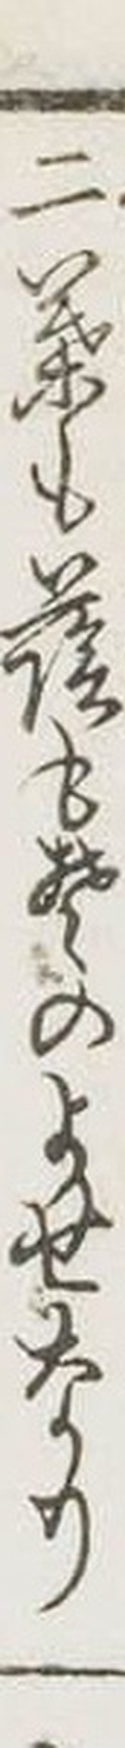二葉も蔭もそのよせなり
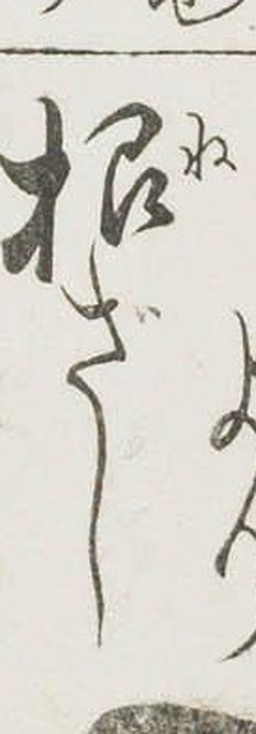根ざし
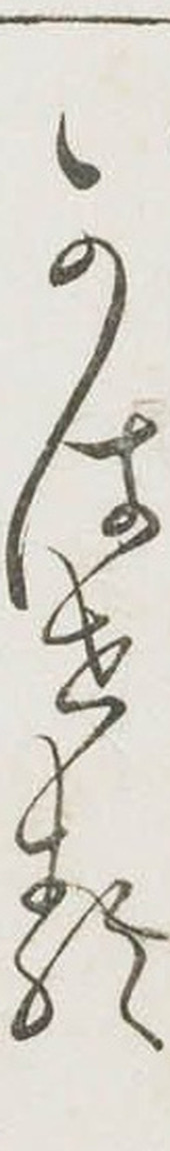かはせる
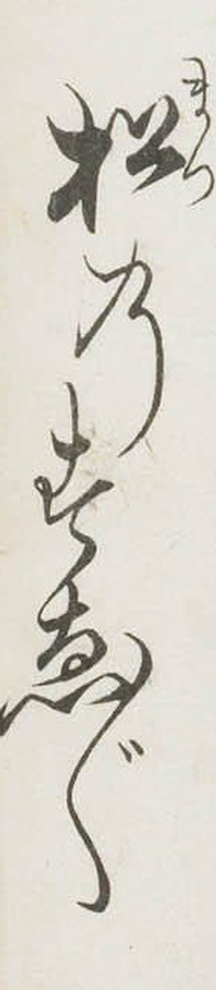松のすゑ〴〵
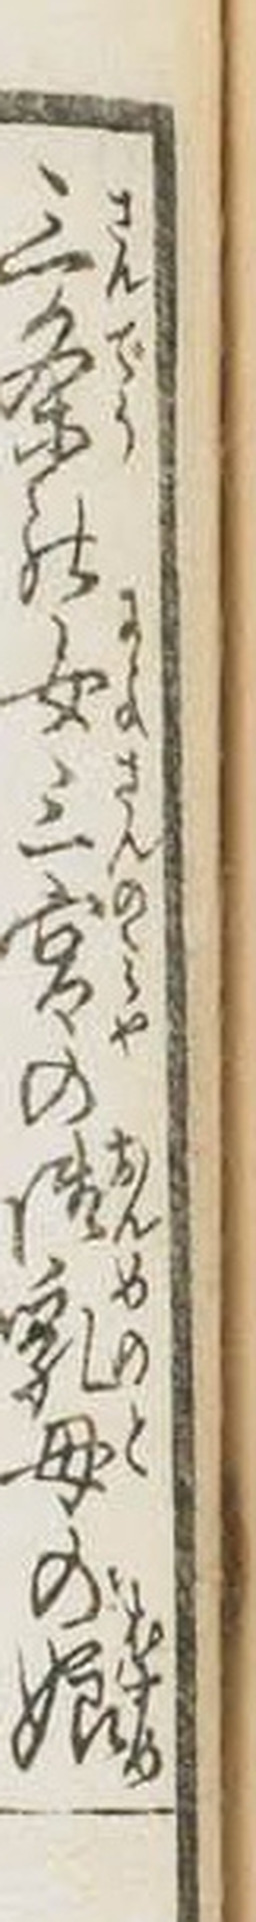三条の女三宮の御乳母の娘
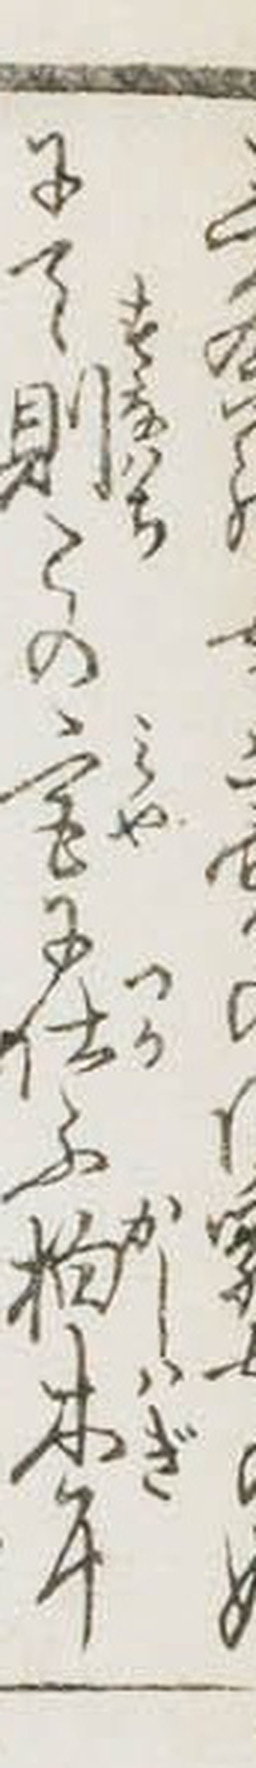にて則この宮に仕ふ柏木に
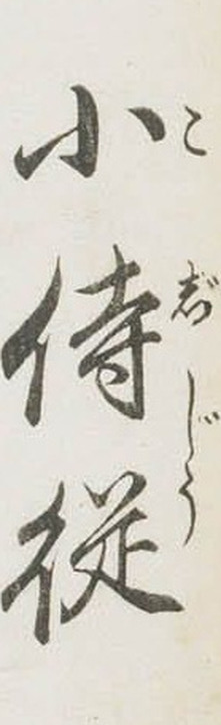小侍従
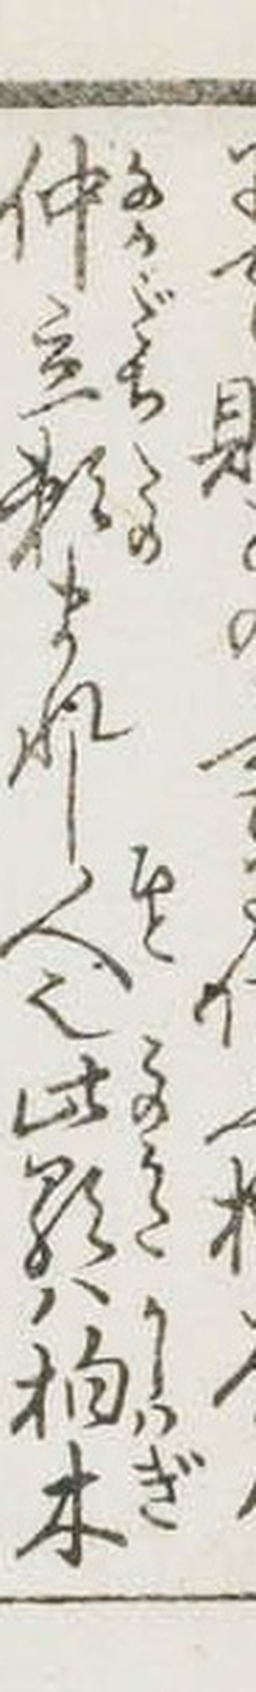仲立頼まれし人也此歌は柏木
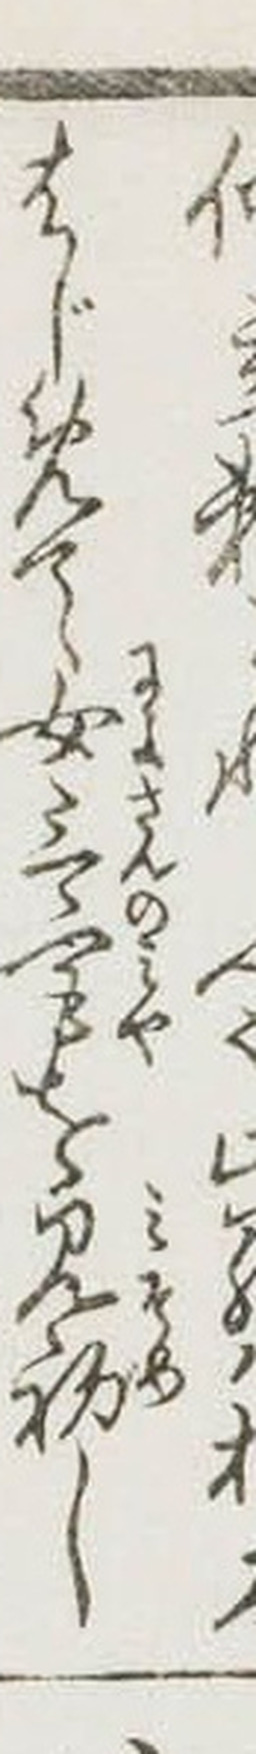はじめて女三宮を見初し
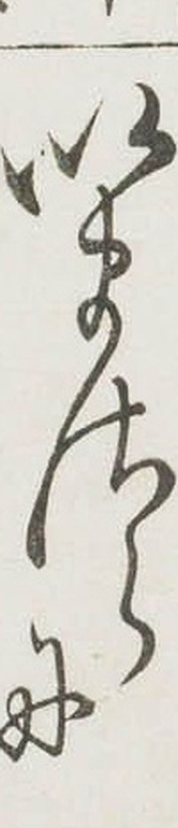いまさらに
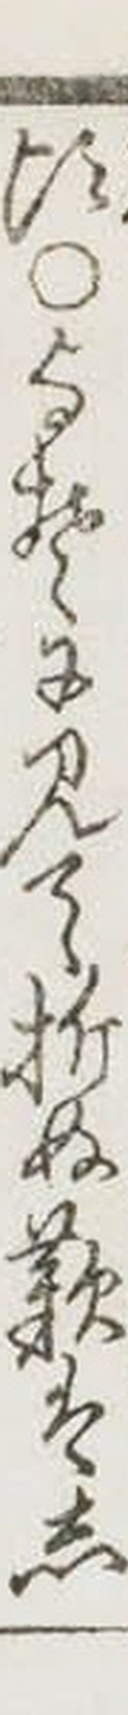頃○よそに見て折ぬ歎はし
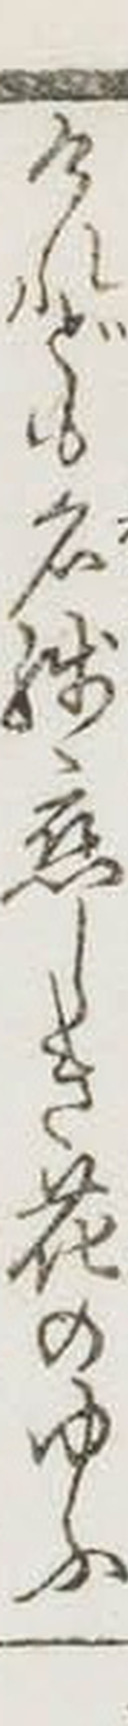けれども名残恋しき花のゆふ
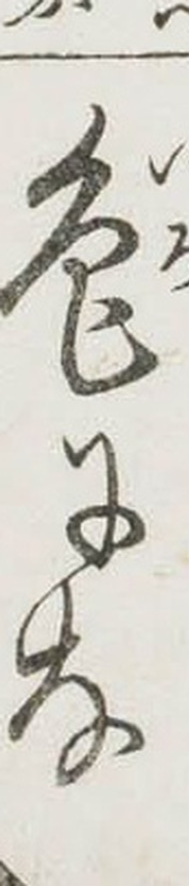色にな
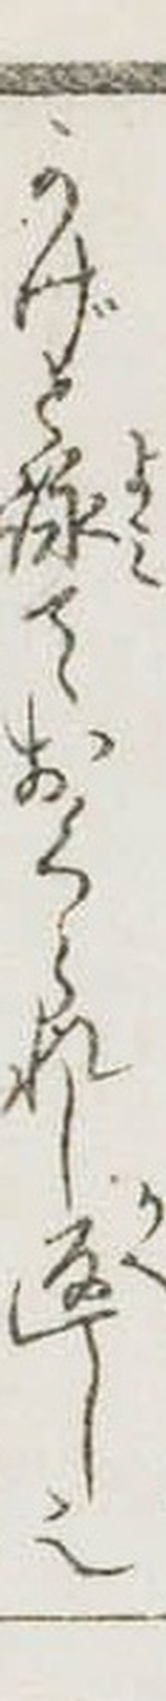かげと詠ておくられし返し也
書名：源氏百人一首
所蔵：東京学芸大学教育コンテンツアーカイブ
